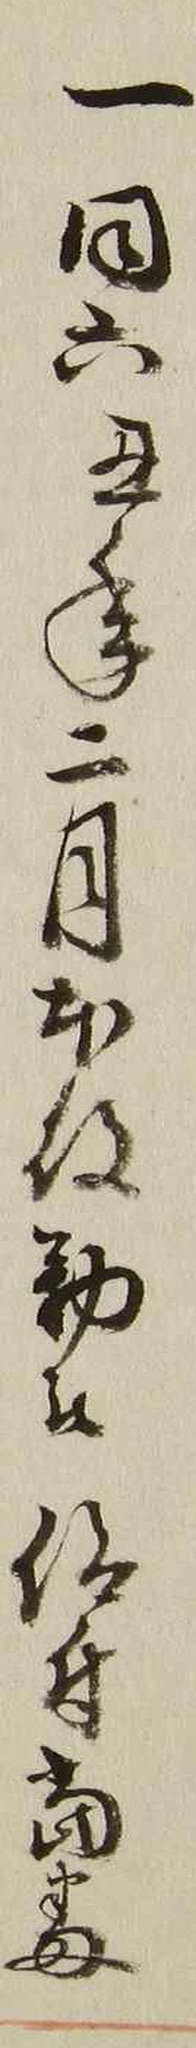一同六丑年二月翻訳勤被仰付当番
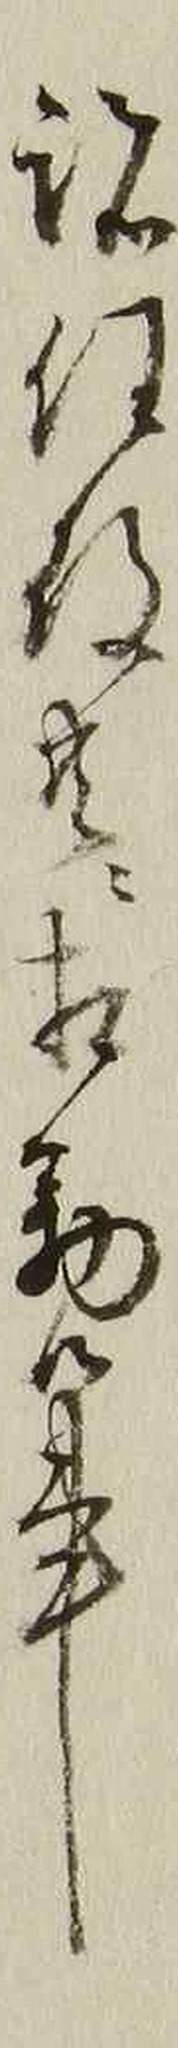諸任役共ニ相勤候事
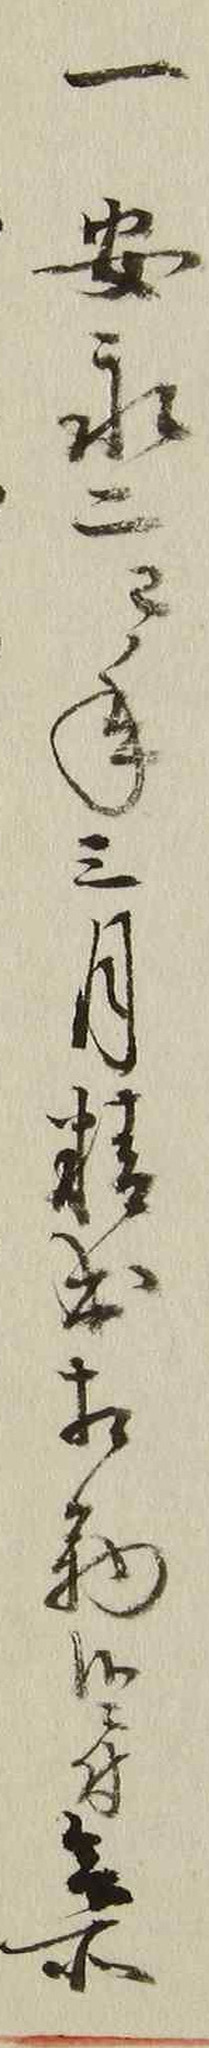一安永二巳年三月精出相勤候ニ付会所
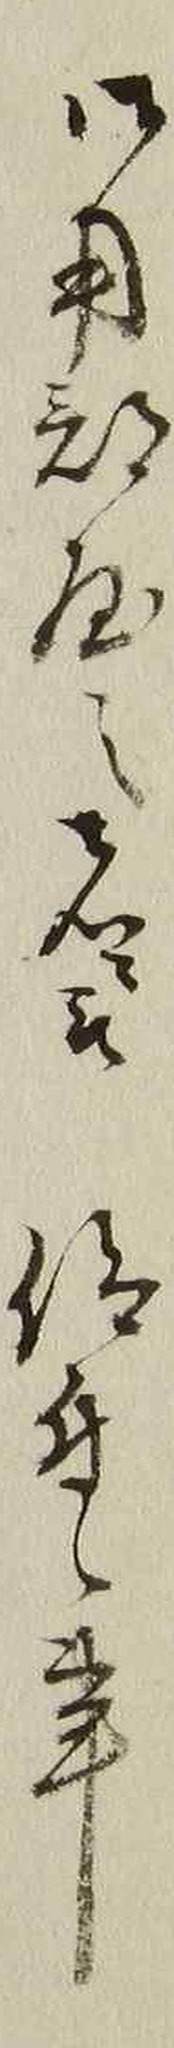御用部屋之者ニ被仰付候事
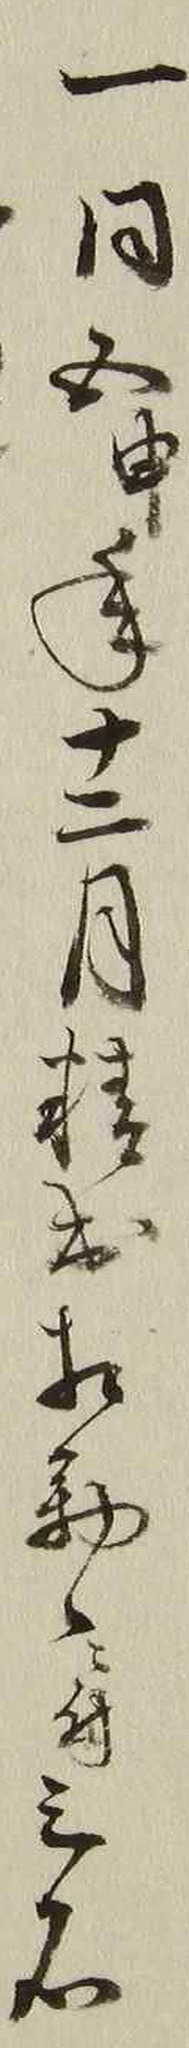一同五申年十二月精出相勤候ニ付三石
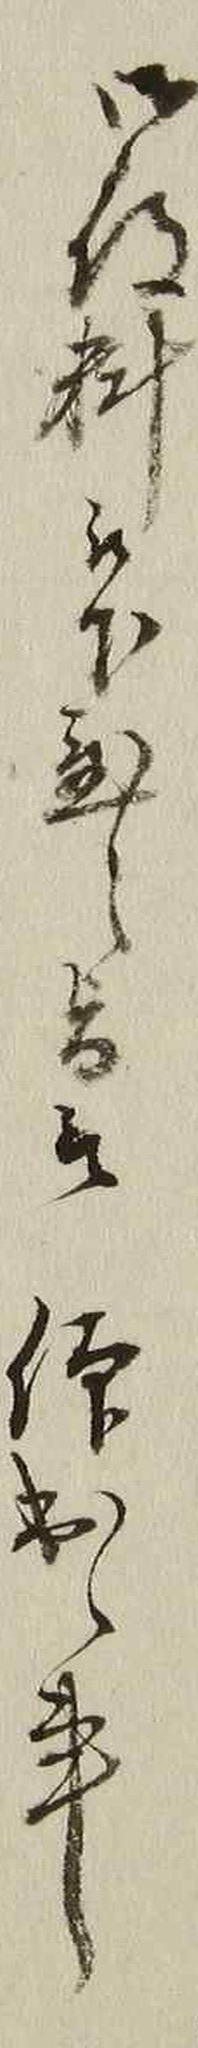御役料被下置之旨被仰出候事
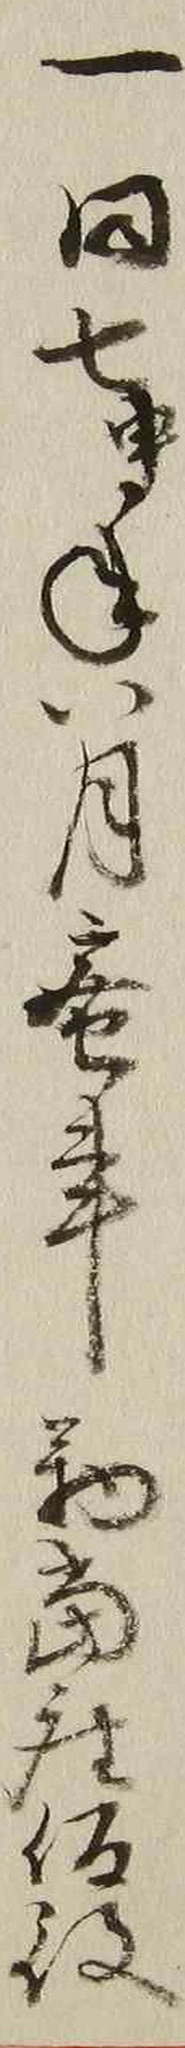一同七申年八月密事勤当座仮役
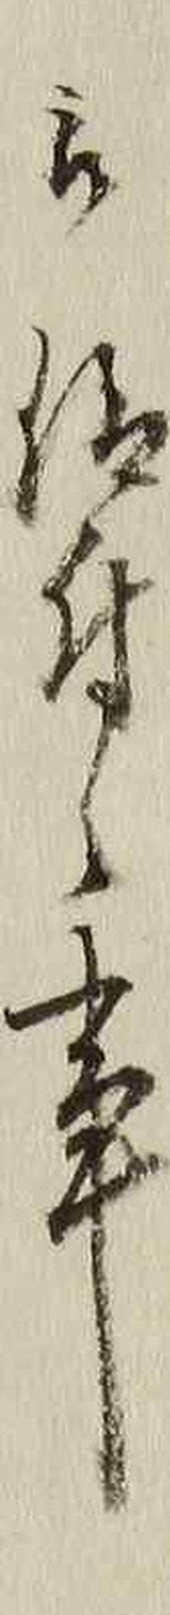被仰付候事
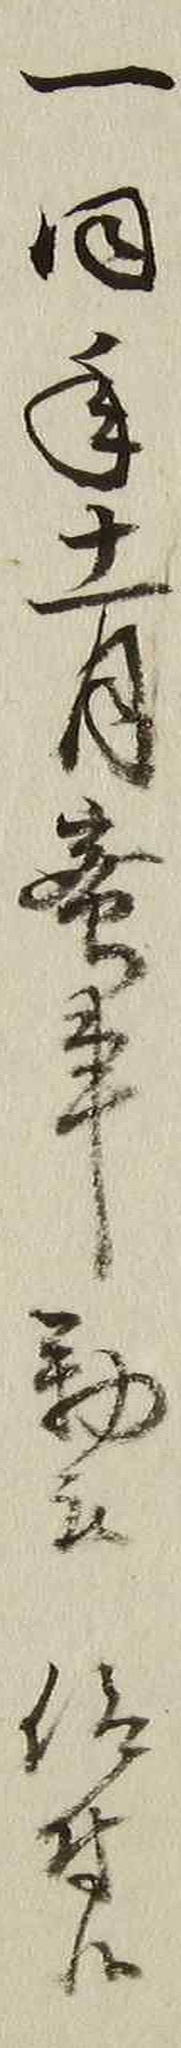一同年十一月密事勤被仰付候
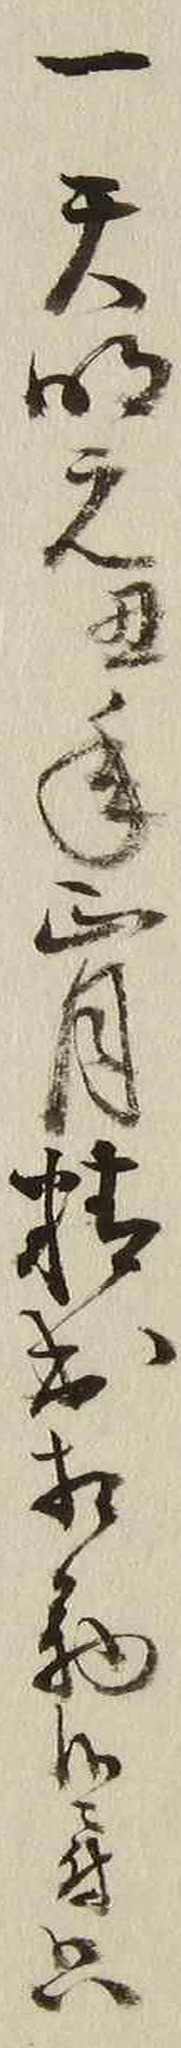一天明元丑年正月精出相勤候ニ付只
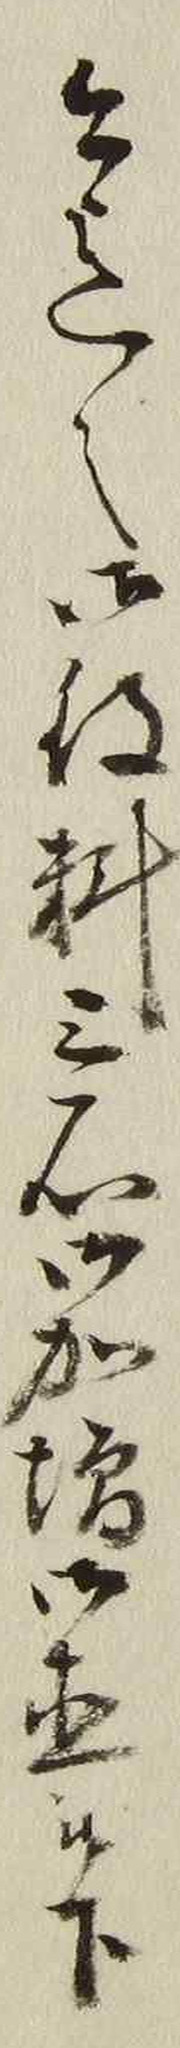今迄之御後料三石御加増御直被下
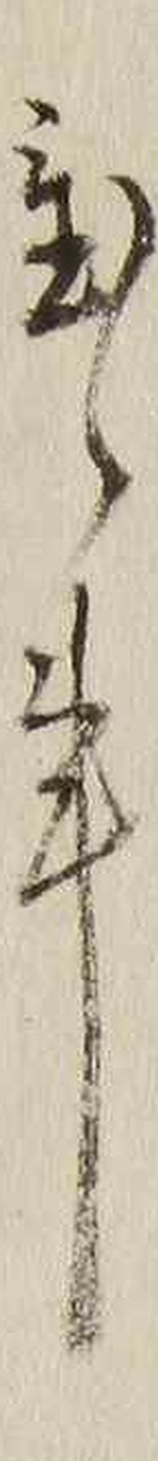置候事
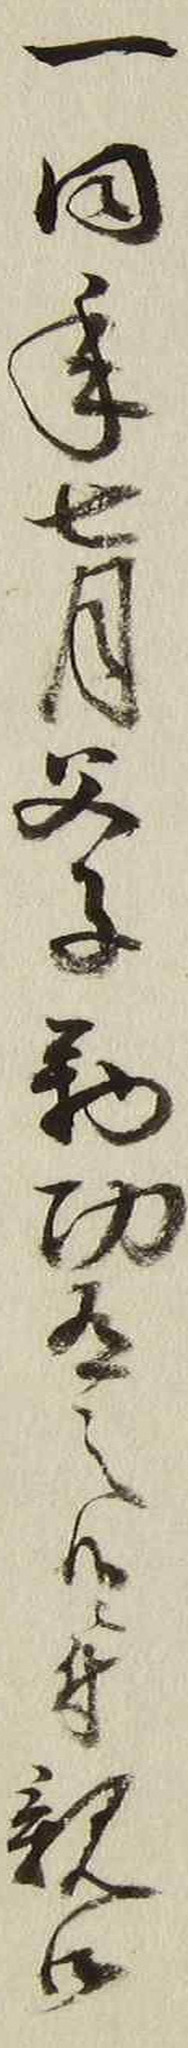一同年七月父子勤功有之候ニ付親御
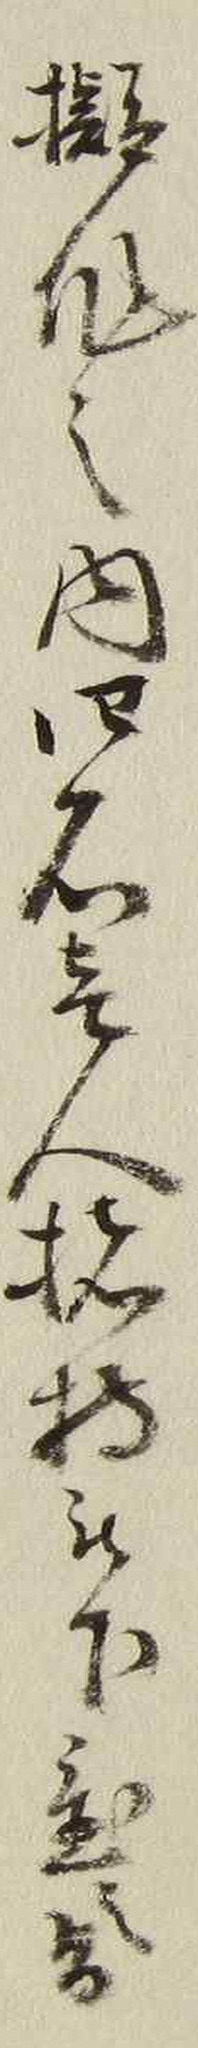擬作之内四石壱人扶持被下置之旨
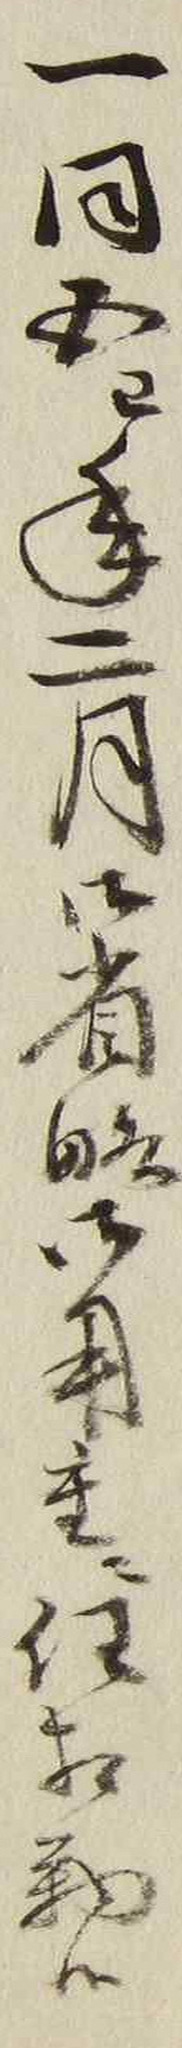一同五巳年二月御省略御用重ニ任相勤候

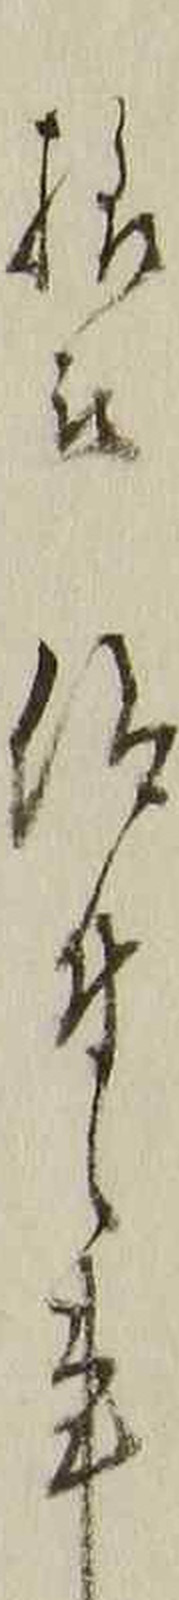様被仰付候事
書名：諸士系譜　巻之36　は之部4
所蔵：会津若松市立会津図書館
